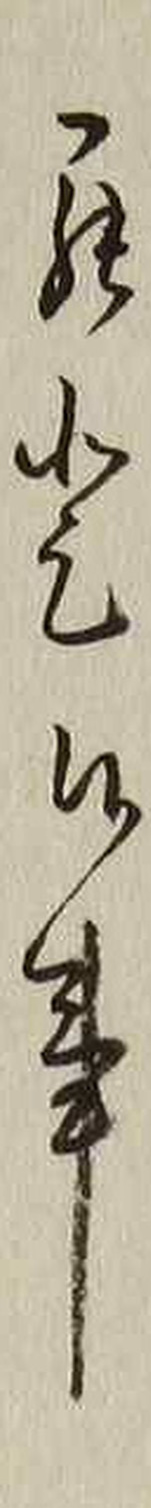罷登候事
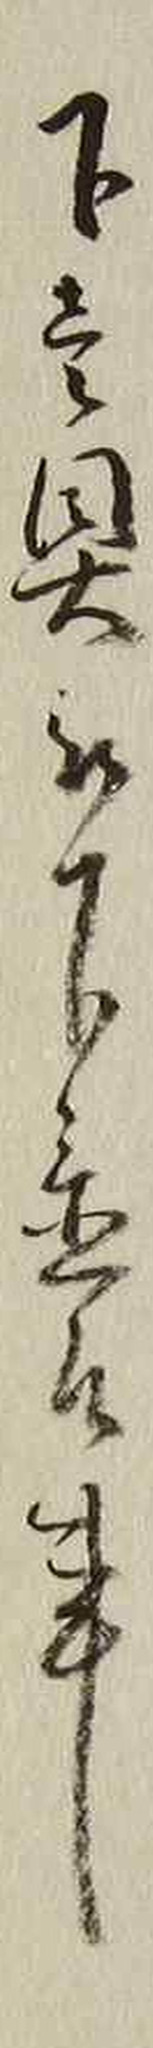下壱具被下置候事
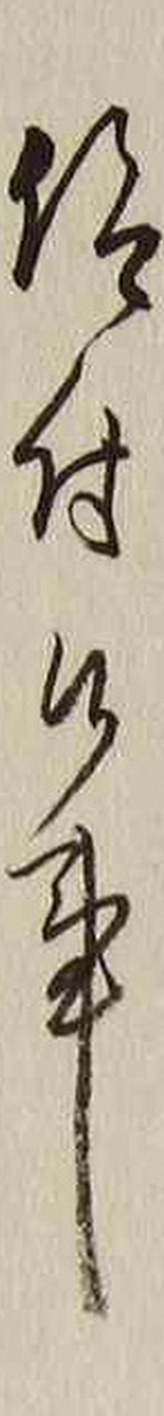仰付候事
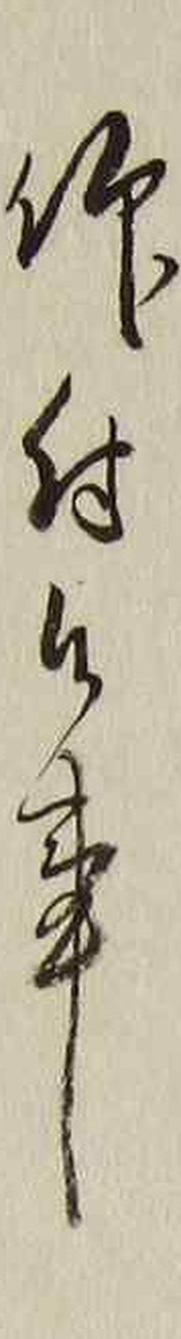仰付候事
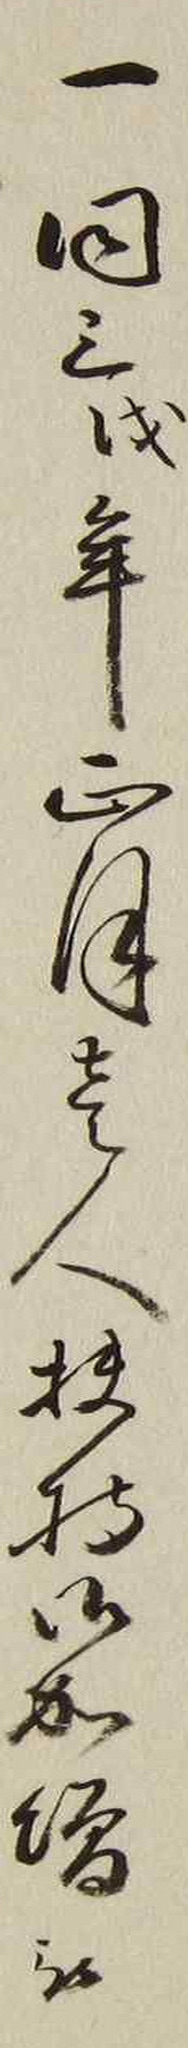一同三戌年正月壱人扶持御加増被
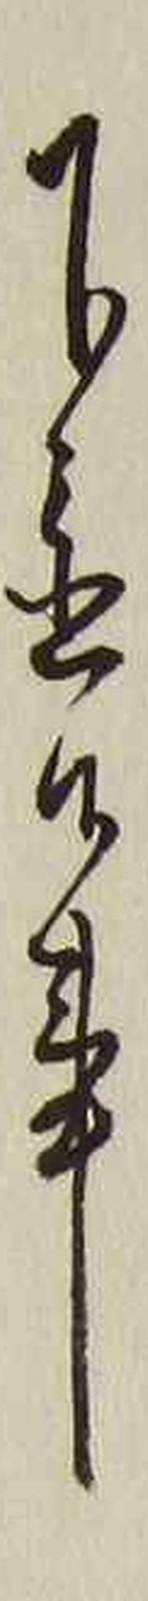下置候事

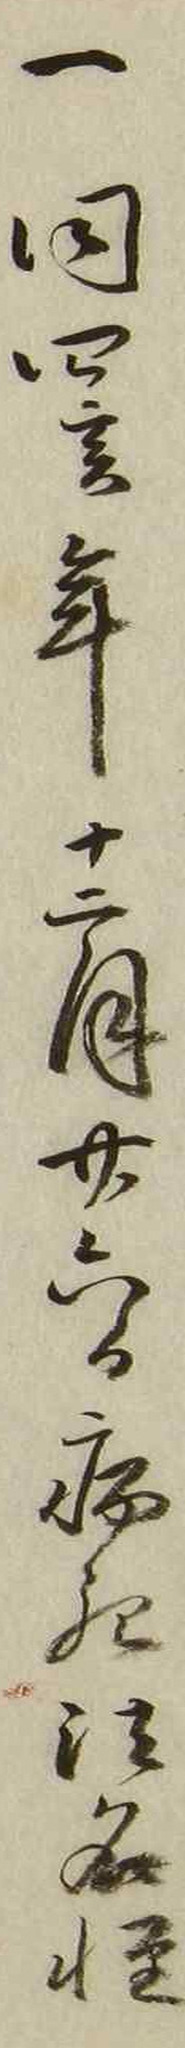一同四亥年十二月廿六日病死法名軽
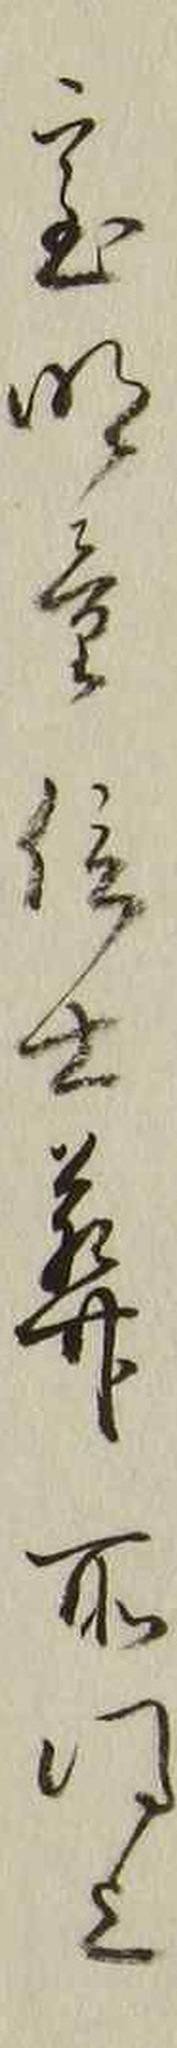宝明童信士葬所同上
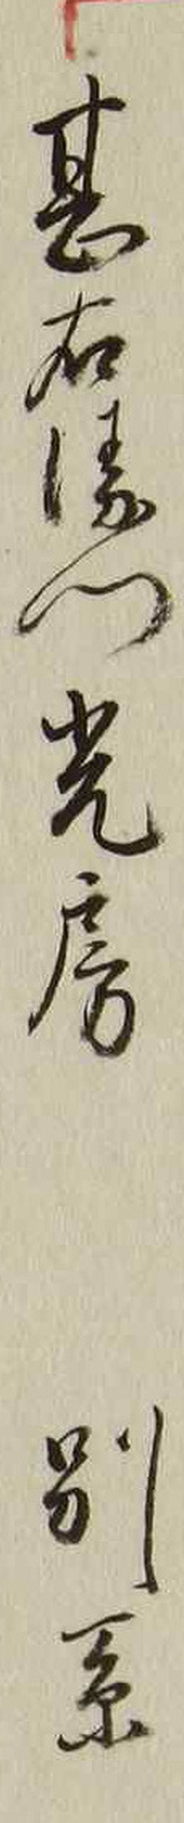甚右衛門光房別系
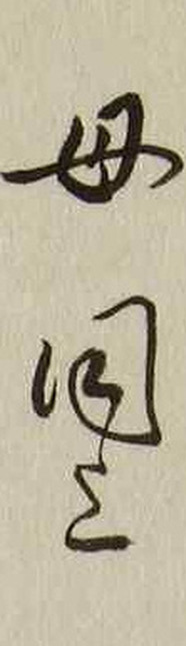母同上
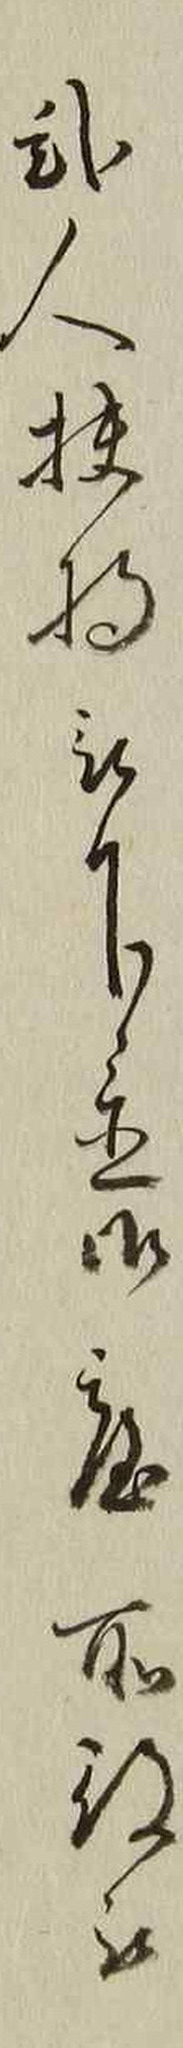弐人扶持被下置御台所役被
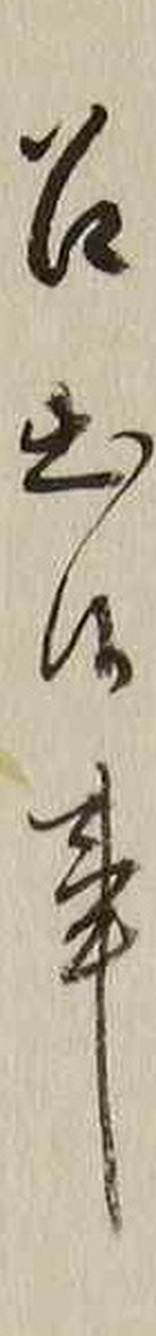召出候事
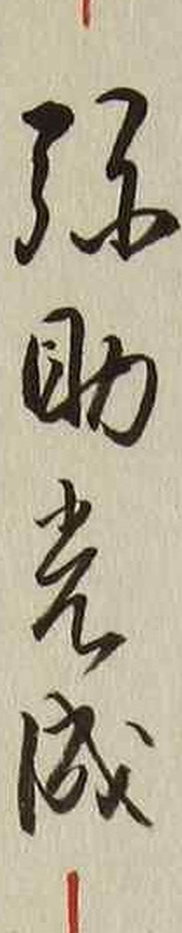孫助光成
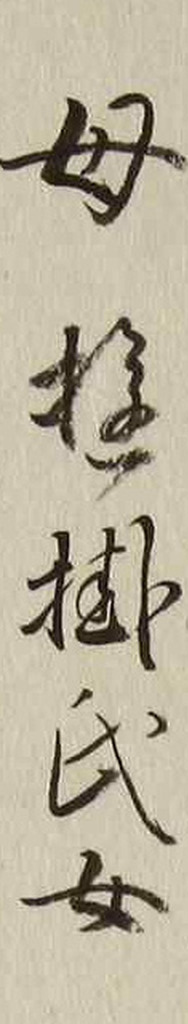母遊掛氏女
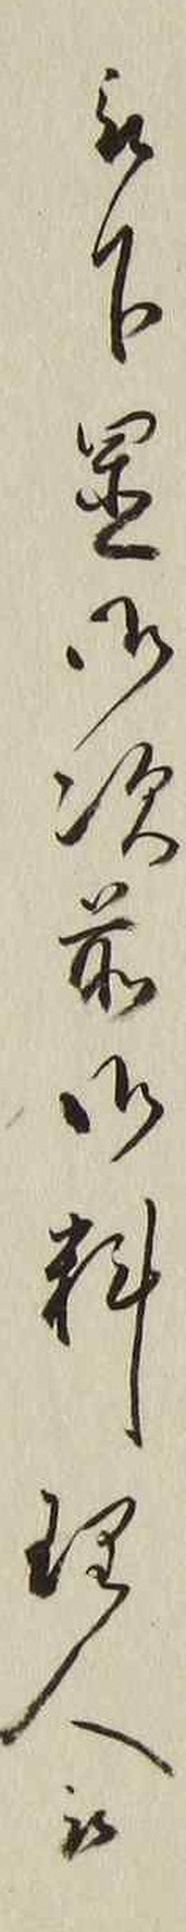被下置御次前御料理人被
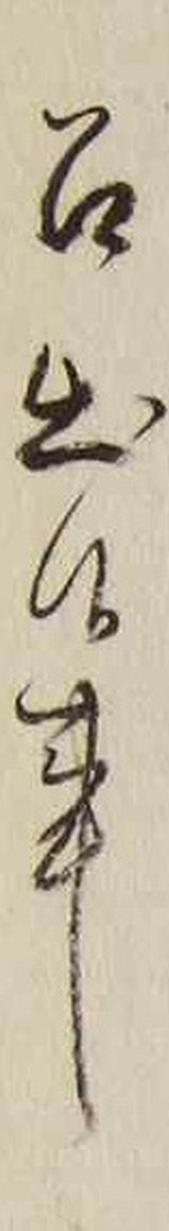召出候事
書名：諸士系譜　巻之10　い之部10
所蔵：会津若松市立会津図書館
